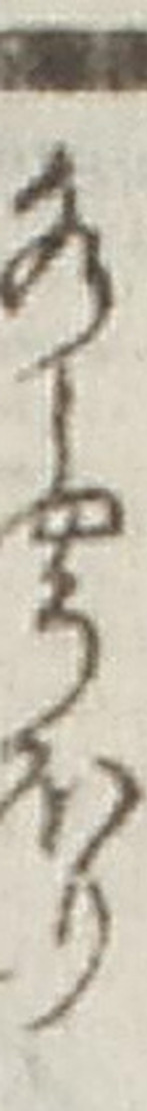水しやうほり
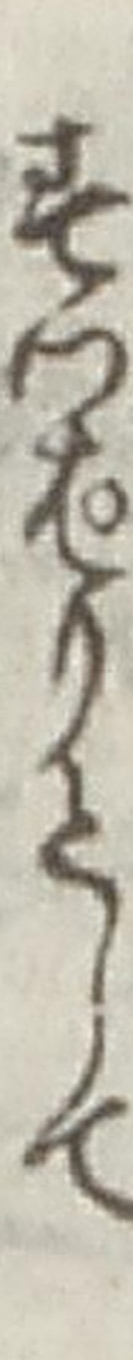すつぱりとして
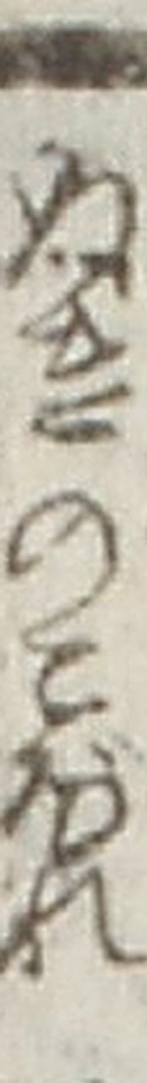ぬきのこぼれ
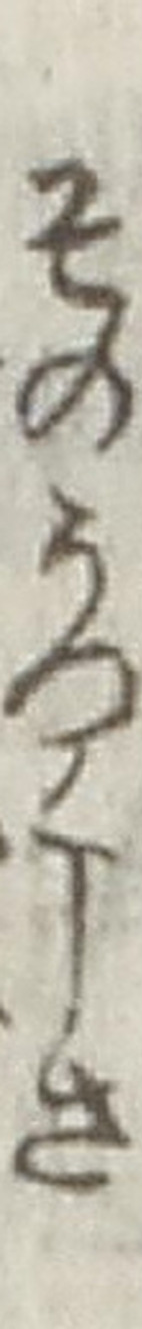そのうつくしさ
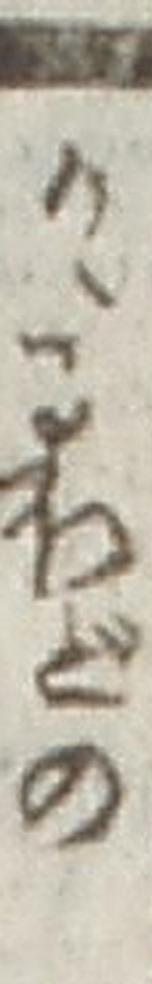かゝるほどの
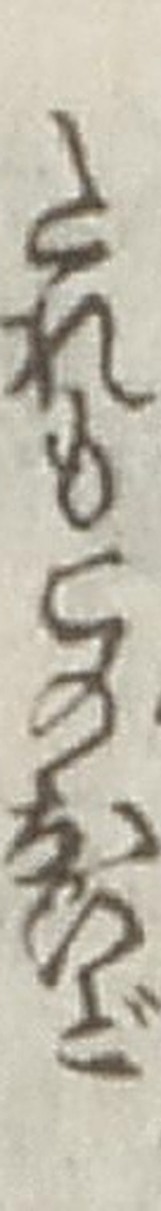たれもこのおいど
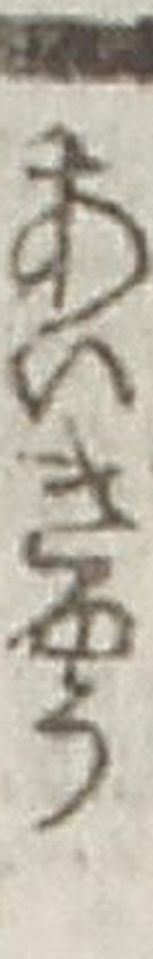あいきやう
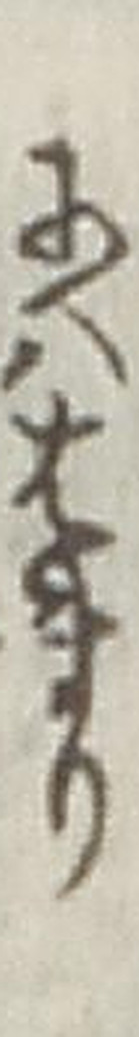にははまり
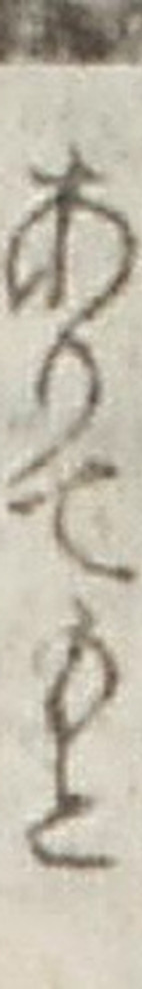ありてもと
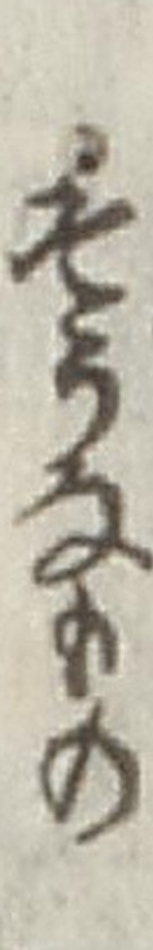そうなもの
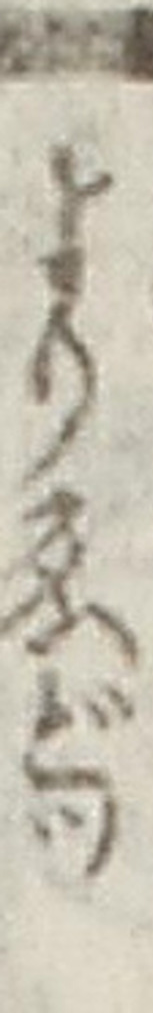よりゑどッ
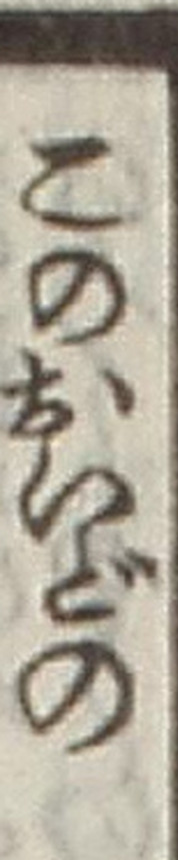このおいどの
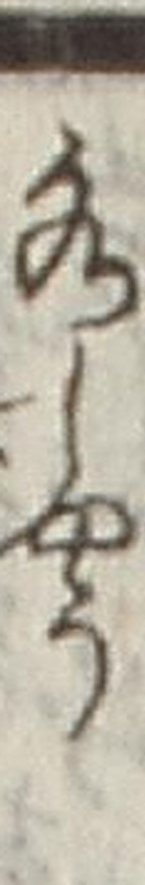水しやう
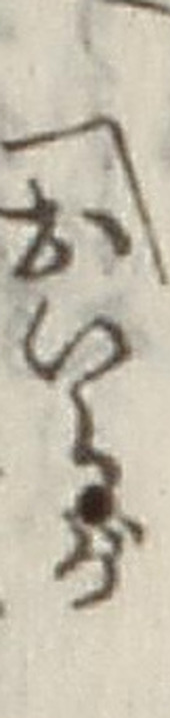〽おいらが
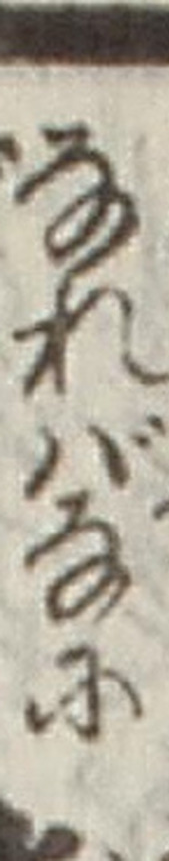なればなに
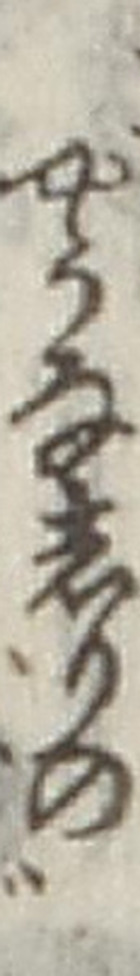やうなしりの
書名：三世相出雲當座帳　上下冊
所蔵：東京大学地震研究所図書室 Earthquake Research Institute Library, The University of Tokyo, JAPAN
